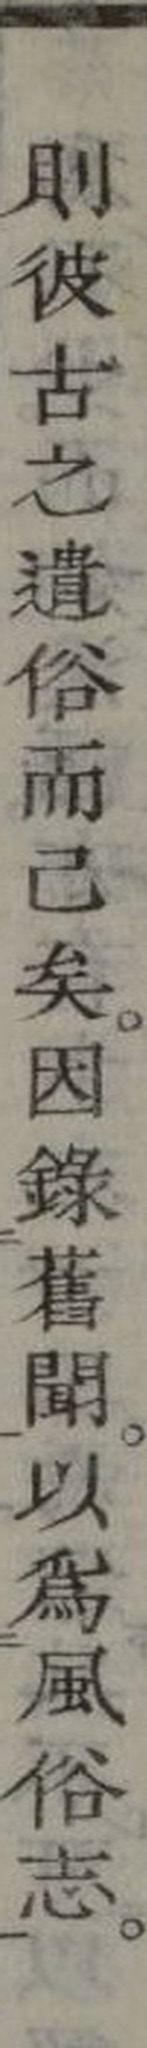則彼古之遺俗而已矣。因錄舊聞。以爲風俗志。
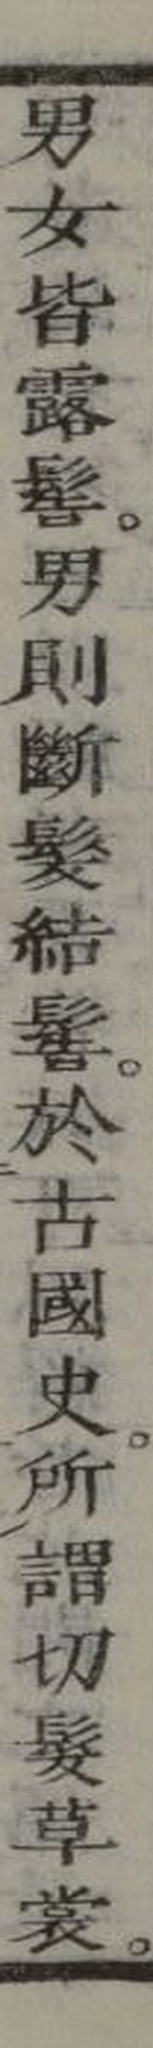男女皆露䯻。男則斷髪結䯻。於古國史。所謂切髪草裳。
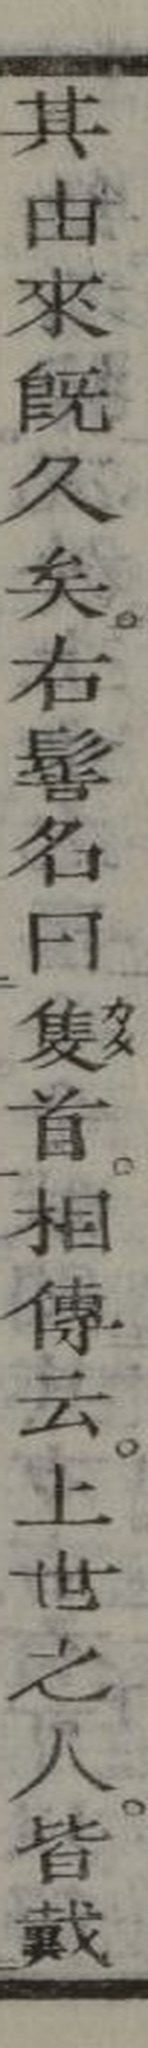其由來既久矣。右䯻名曰隻首。相傳云。上世之人。皆戴
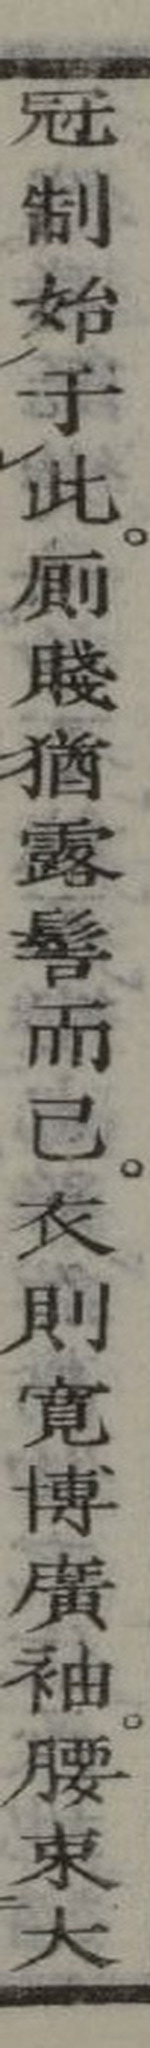冠制始于此。厠賤猶露䯻而已。衣則寛博廣袖。腰束大
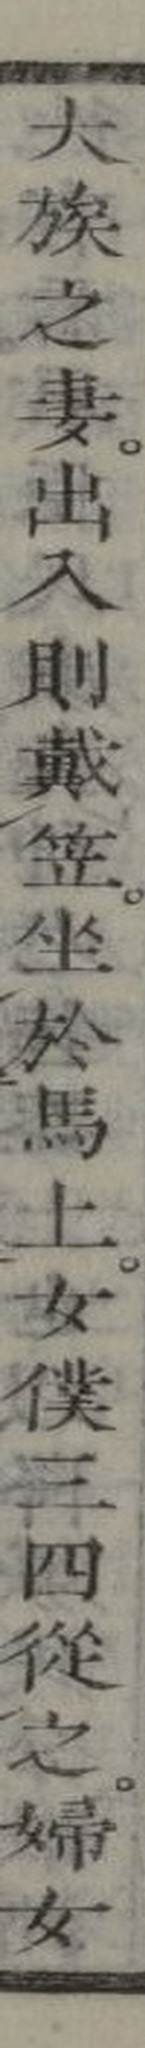大族之妻。出入則戴笠。坐於馬上。女僕三四從之。婦女
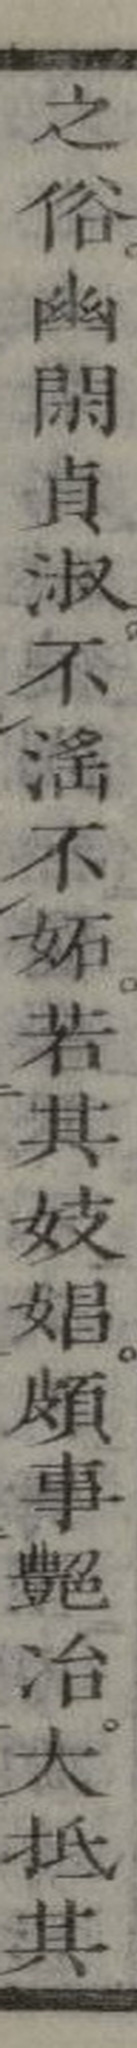之俗。幽閑貞淑。不滛不妬。若其妓娼。頗事艶冶。大抵其
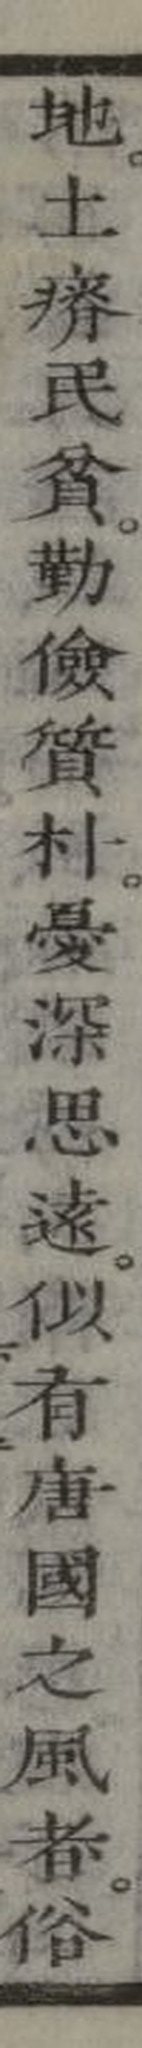地。土瘠民貧。勤儉質朴。憂深思逺。以有唐國之風者。俗

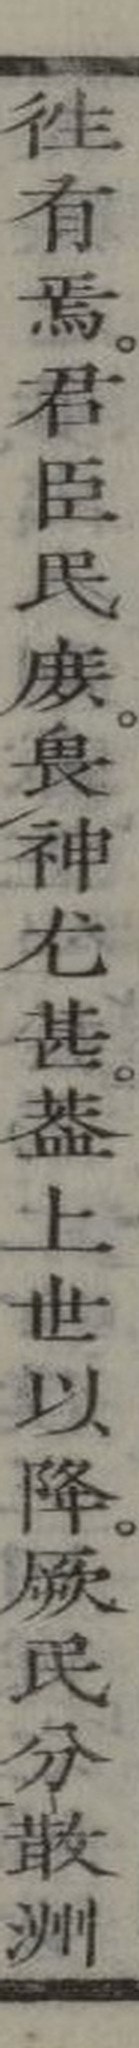徃有焉。君臣民庻。畏神尤甚。葢上世以降。厥民分-散洲
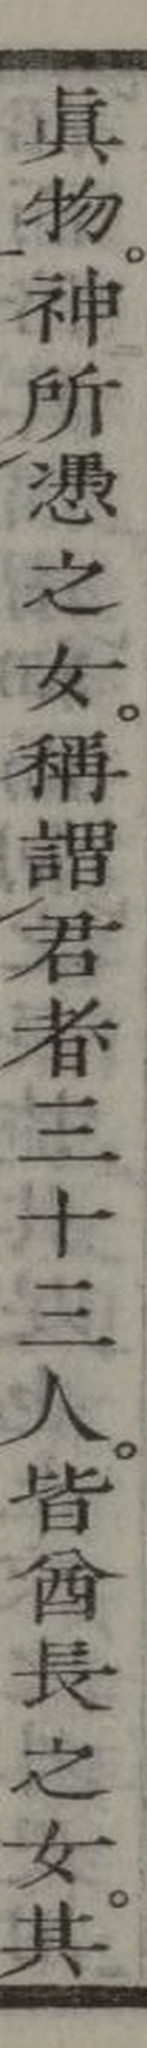眞物。神所慿之女。稱謂君者三十三人。皆酋長之女。其
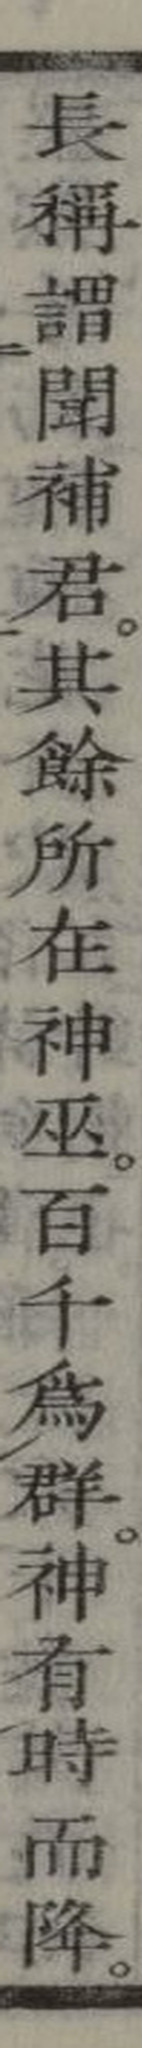長稱謂聞補君。其餘所在神巫。百千爲群。神有時而降。
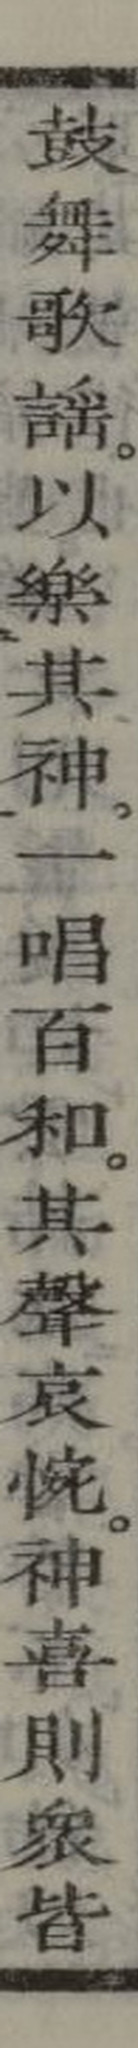鼓舞歌謡。以樂其神。一唱百和。其聲哀惋。神喜則衆皆

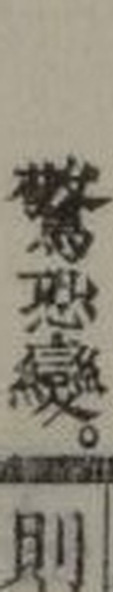驚恐變。
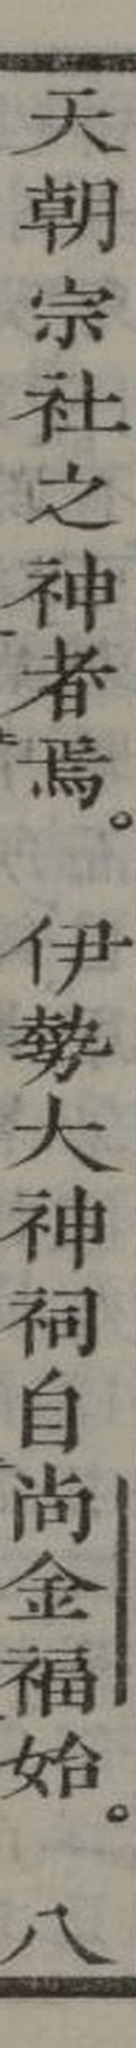天朝宗社之神者焉。伊勢大神祠自尚金福始。八
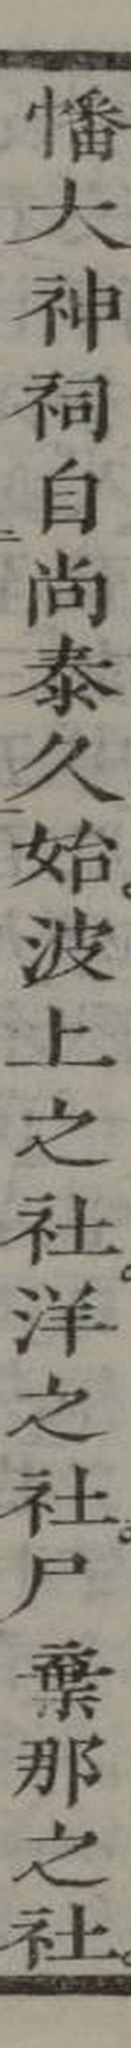幡大神祠自尚泰久始。波上之社。洋之社。尸棄那之社。
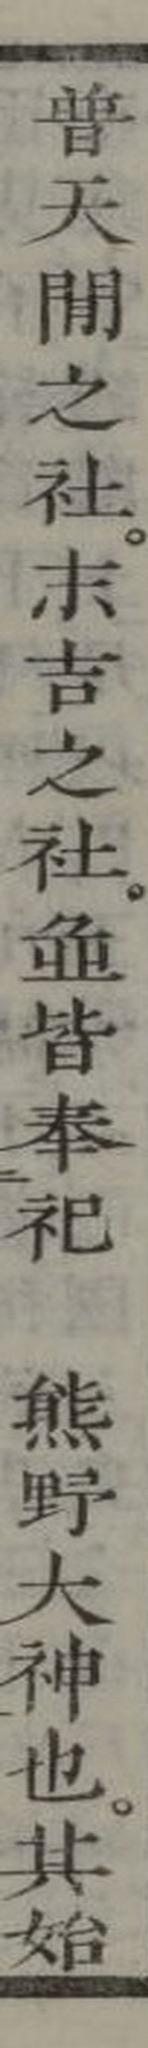普天閒之社。末吉之社。並皆奉祀熊野大神也。其始
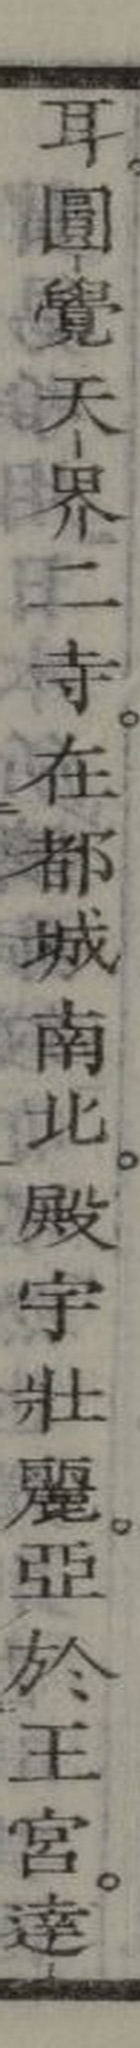耳。圓-覺天-界二寺。在都城南北。殿宇壯麗。亞於王宮。逹-
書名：南島志 呂
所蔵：University of the Ryukyus Library
